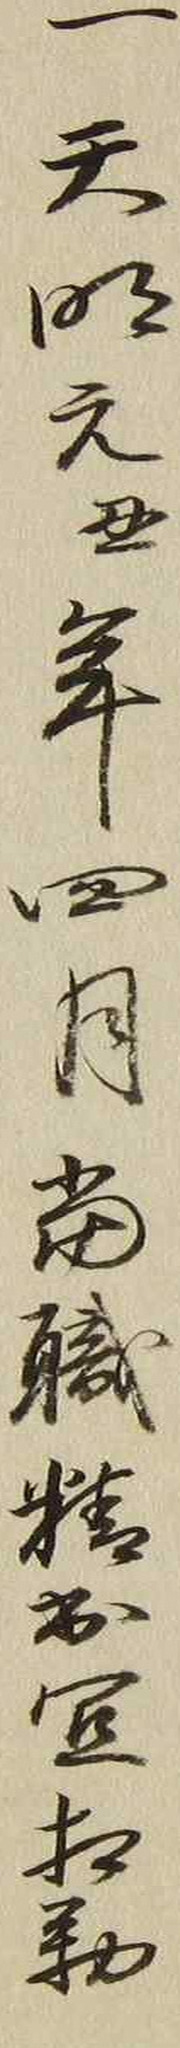一天明元丑年四月当職精出宜相勤
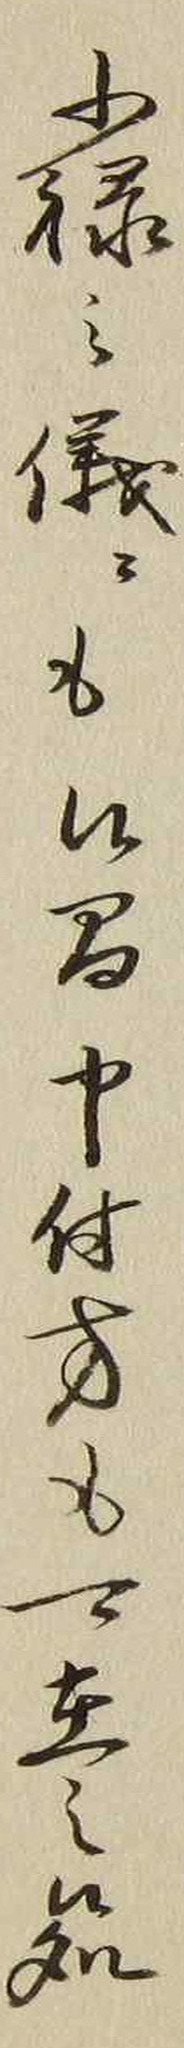小禄之儀にも候間申付方も可在之候処
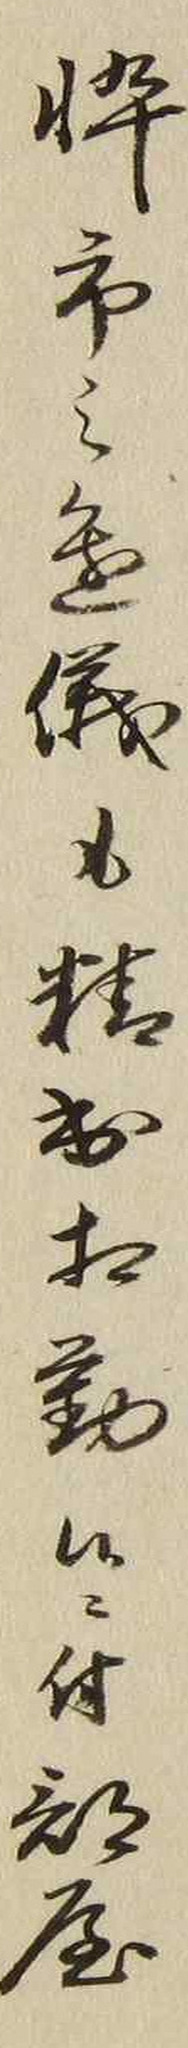忰市之進儀も精出相勤候に付部屋
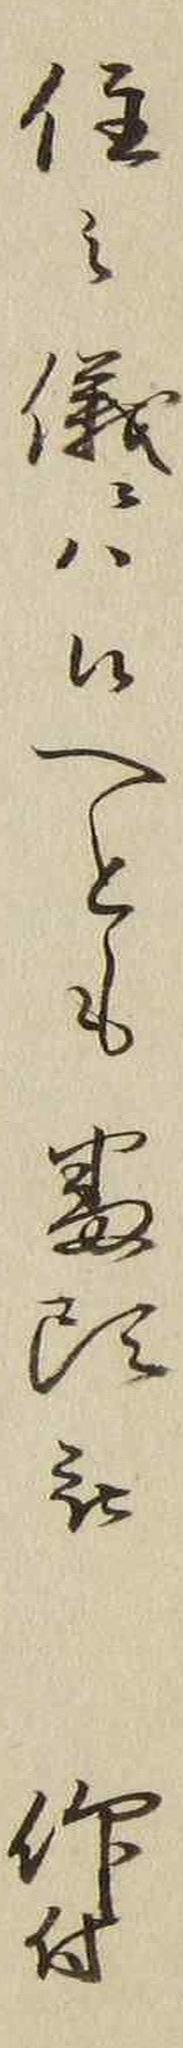住之儀には候へとも番頭被仰付
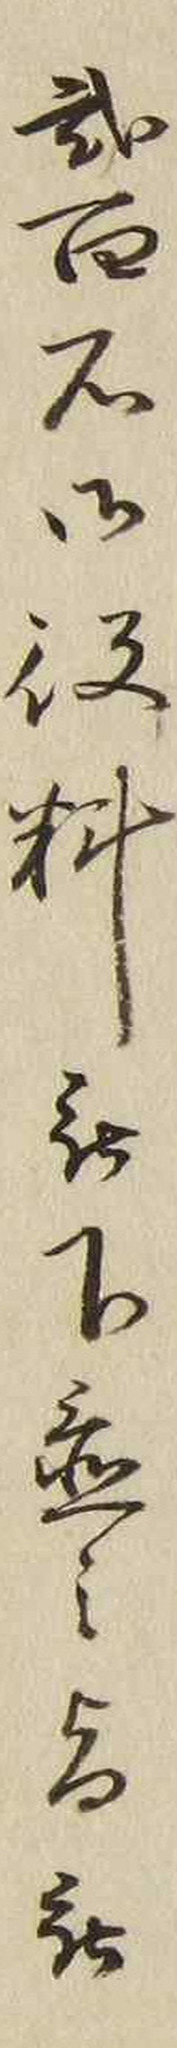弐百石御役料被下置之旨被

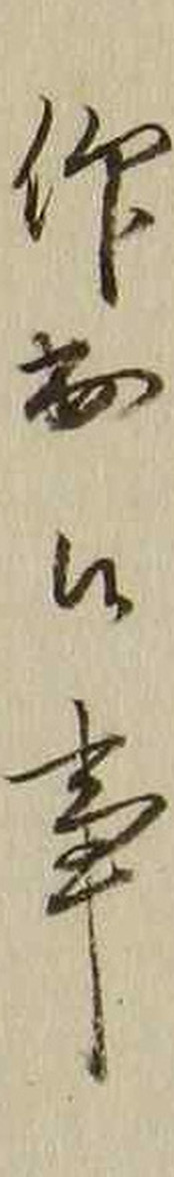仰出候事
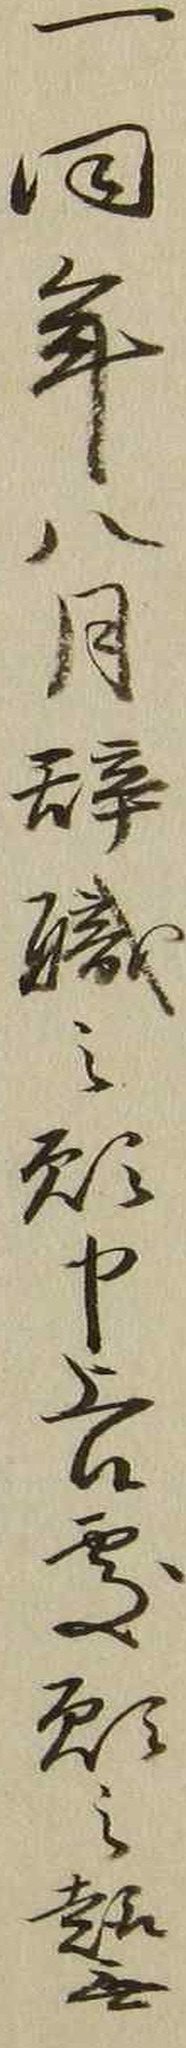一同年八月辞職之願申上候処願之趣無
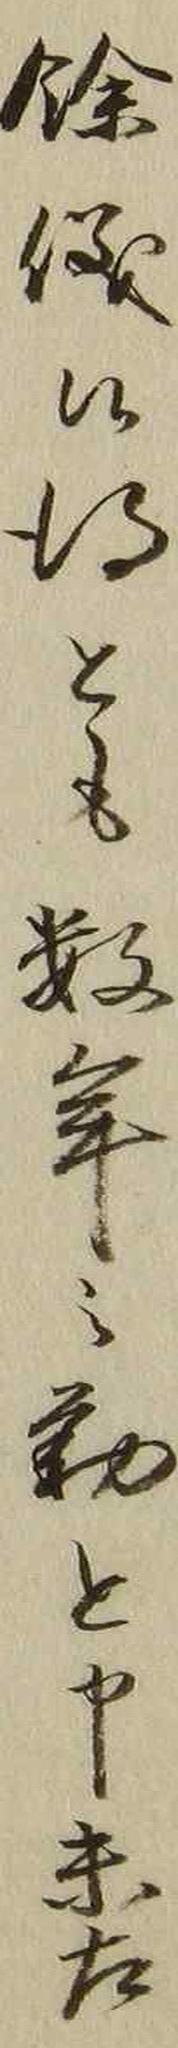余儀候得とも数年之勤と申未左
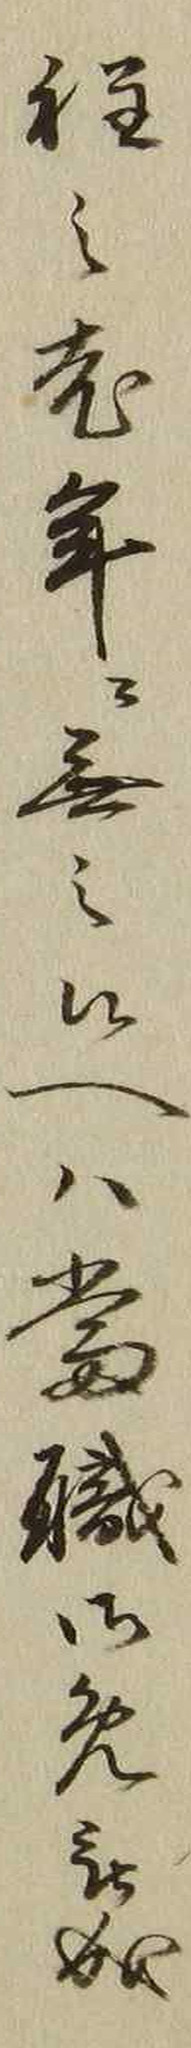程之老年に無之候へは当職御免被成
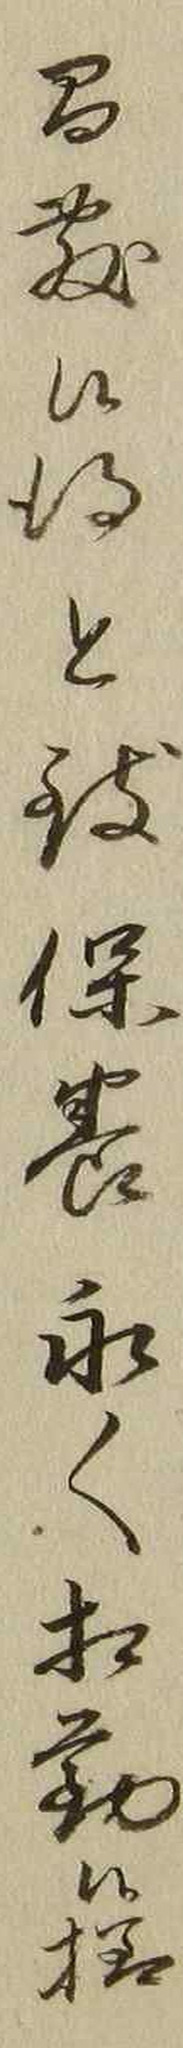間敷候得と致保養永〱相勤候様
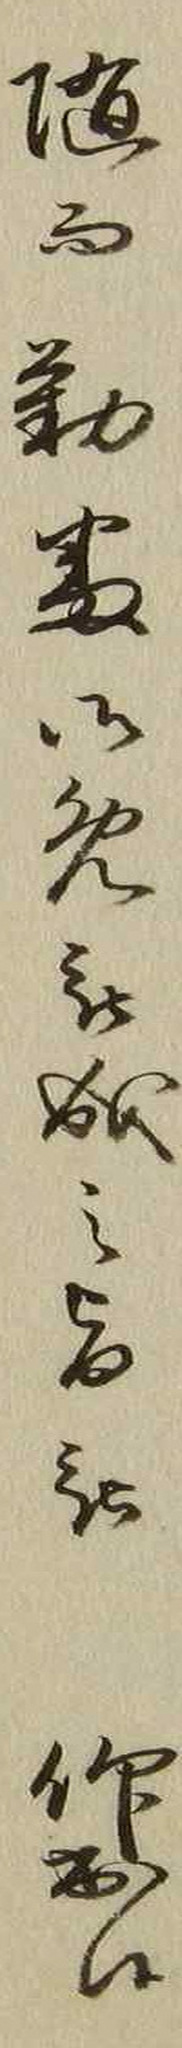随而勤番御免被成旨被仰出候
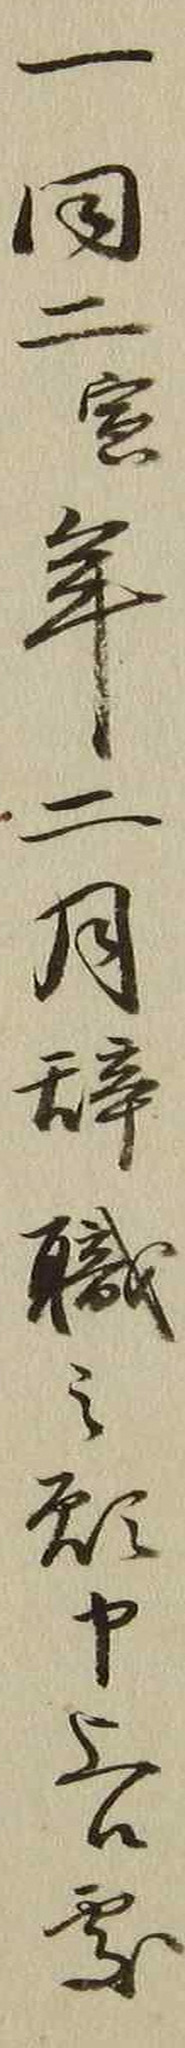一同二寅年二月辞職之願申上候処
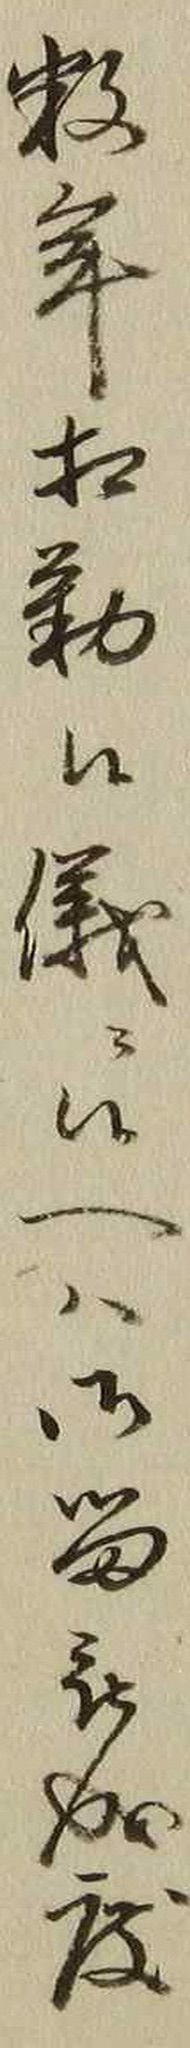数年相勤候儀に候へは御留被成度
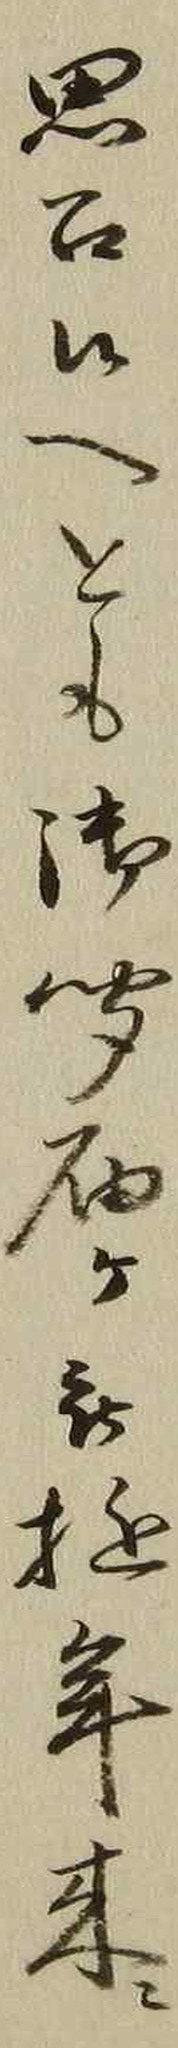思召候へとも御聞届ヶ被遊年来に
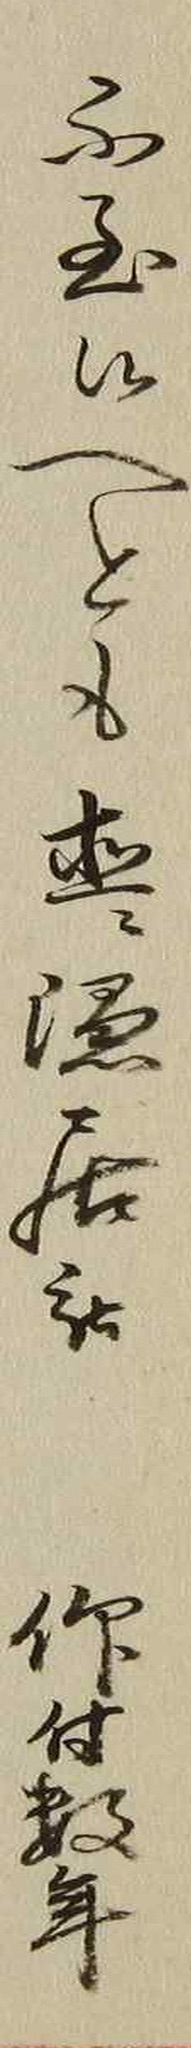不至候へとも直々隠居被仰付数年
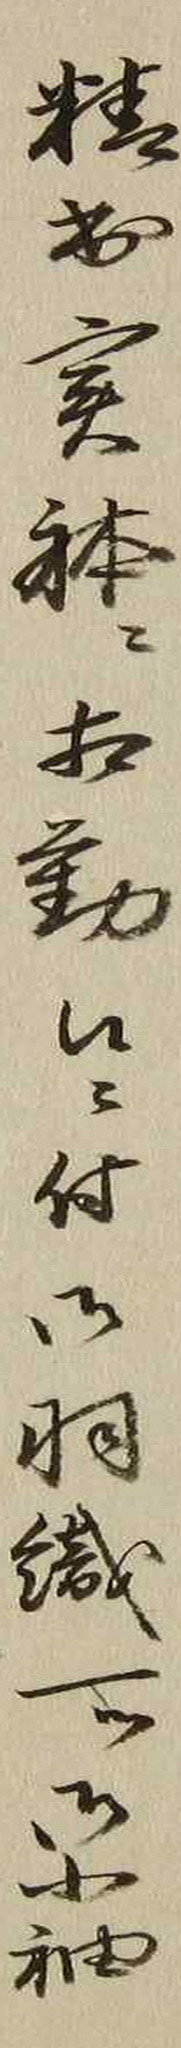精出実体に相勤候に付御羽織一つ御小袖
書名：諸士系譜　巻之133　た之部9
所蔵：会津若松市立会津図書館
